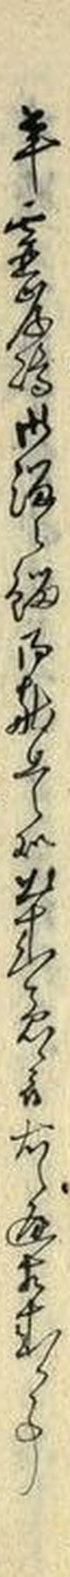年霊岸嶋御溜之鰡御献上之処出来兼候ニ付右之通相成候事
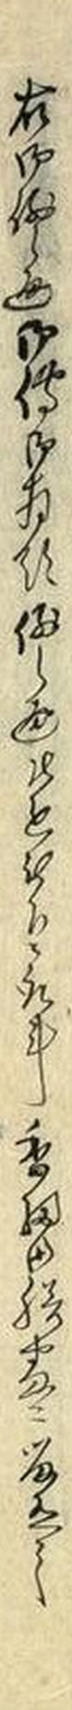右御例之通御伝御拝領例之通被進被下ニ取斗委細御膳番二留記有之
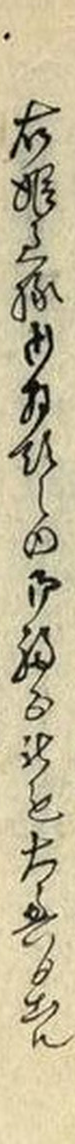右姫君様御拝領之内御福分被進大奥ゟ出ㇽ
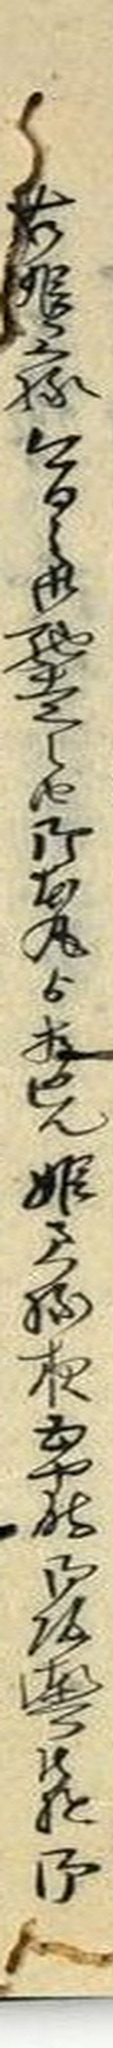右姫君様今日之御馳走之由御本丸ゟ相廻ㇽ姫君様夜五半時御帰輿被遊御
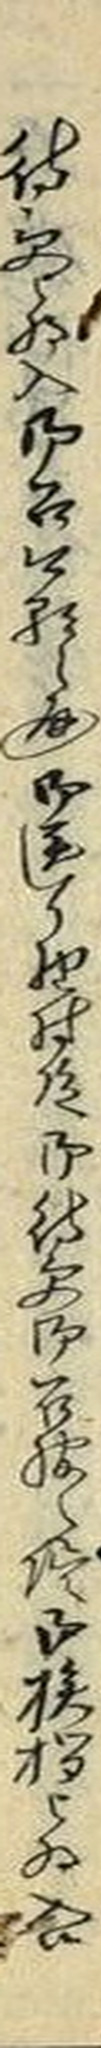待受被為入御召今朝之通御送り野村殿御待受御召服之侭御挨拶被為入候
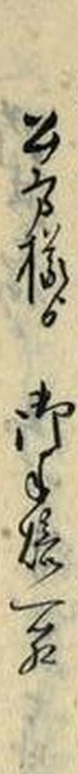公方様ゟ御手焙一箱

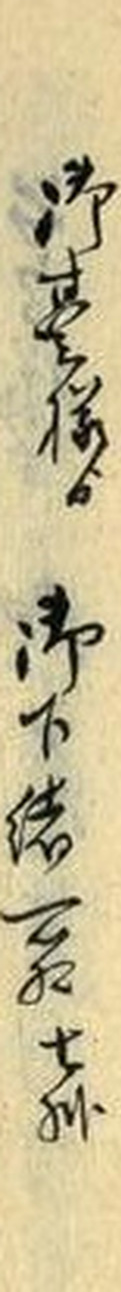御台様ゟ御下緒一箱七掛
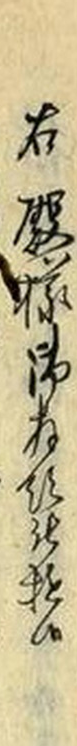右殿様御拝領被遊候
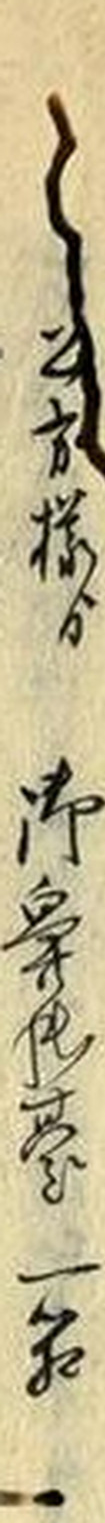公方様ゟ御鼻紙台一箱
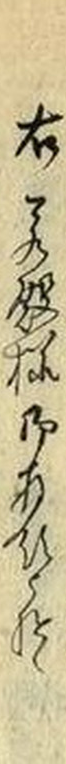右若殿様御拝領被遊候
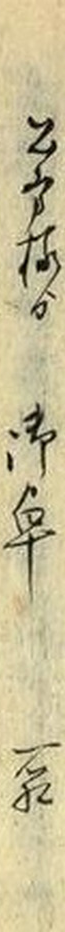公方様ゟ御卓一箱
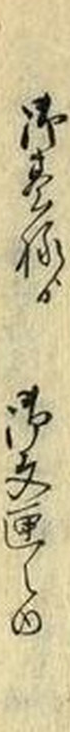御台様ゟ御文匣之内
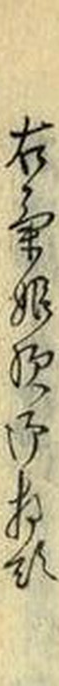右箏姫様御拝領
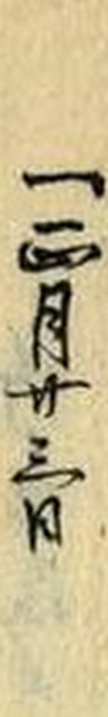一正月廿三日
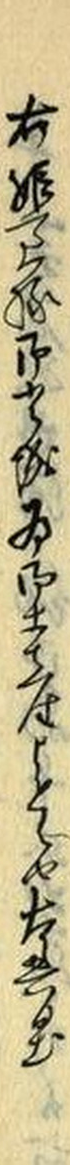右姫君様御登城為御土産被進候由大奥ゟ出
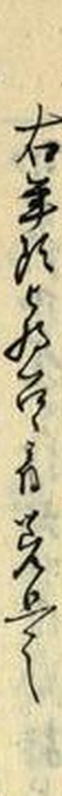右年始被為召候ニ付差上之
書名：少傅日録抄（斉承付側向頭取日記、在府）
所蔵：福井県文書館 Fukui Prefectural Archives
